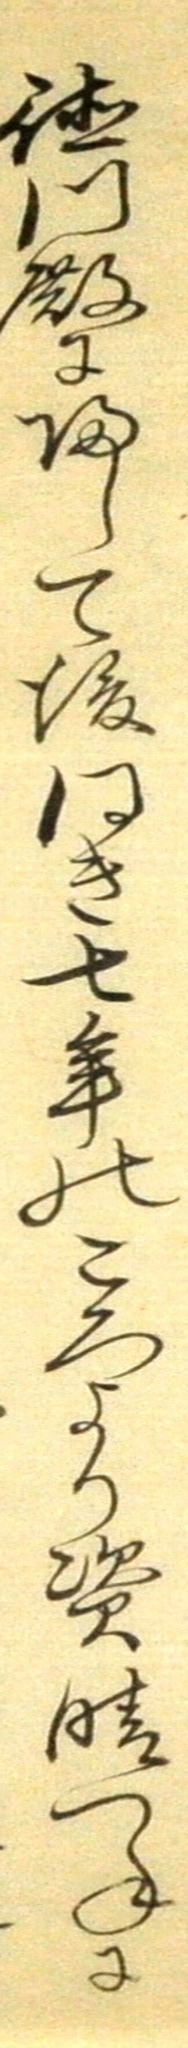徳川殿に帰して後同き七年のころより資晴つねに
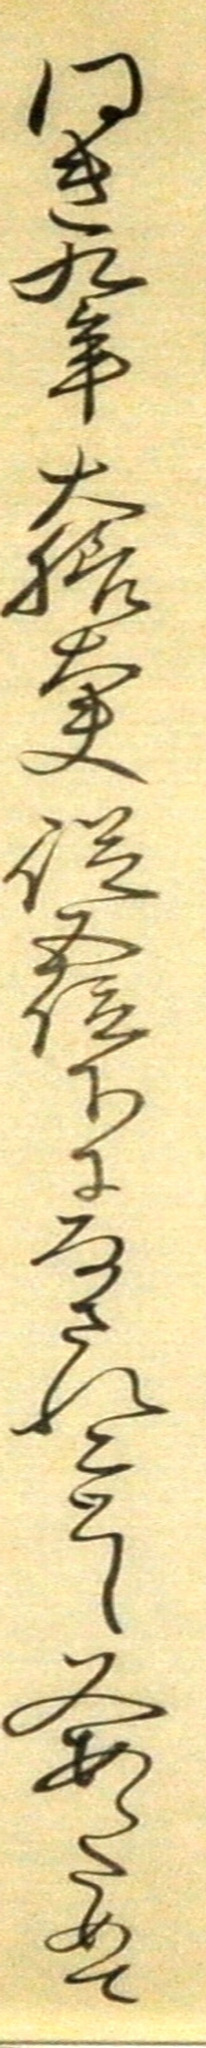同き九年大膳大夫従五位下になされことし又あらためて
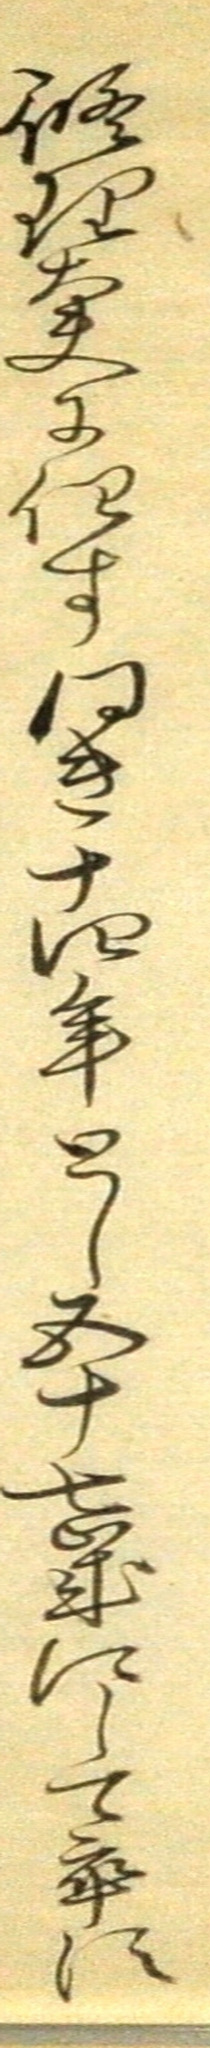修理大夫に任す同き十四年とし五十七歳にして卒す
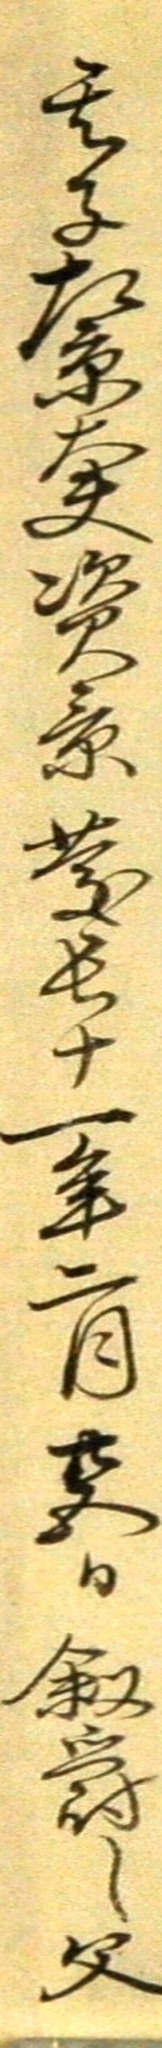其子左京大夫資景慶長十一年二月廿五日叙爵し父

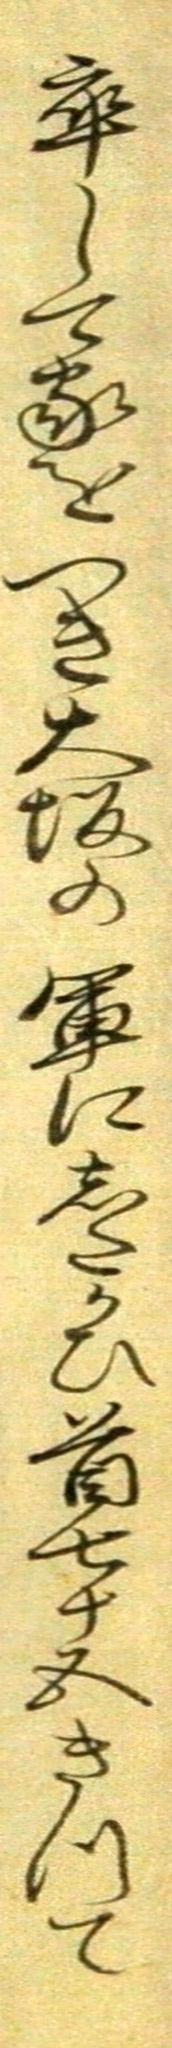卒して家をつき大坂の軍にしたかひ首七十五きつて
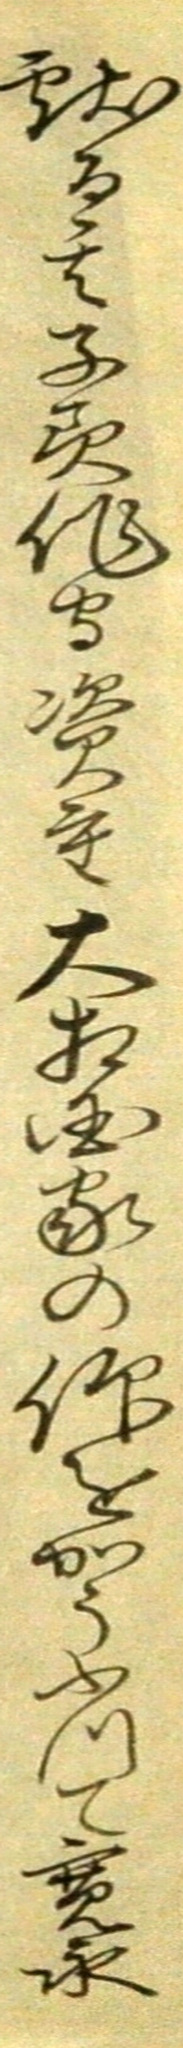献る其子美作守資重大相国家の仰をかうふつて寛永
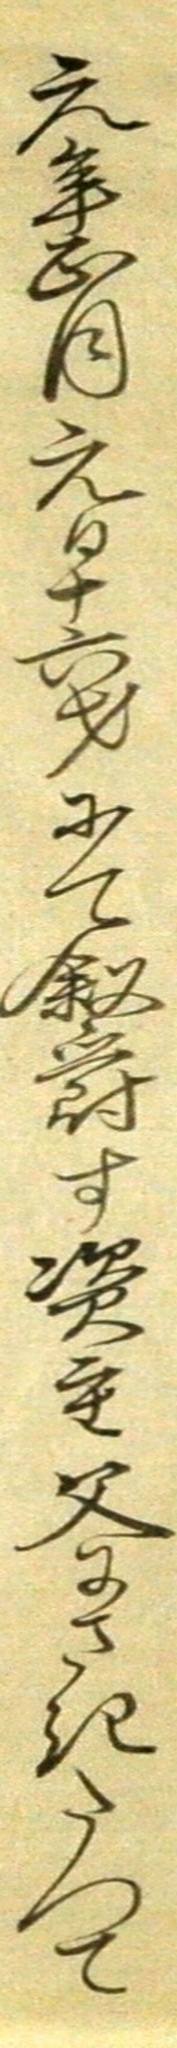元年正月元日十六才にて叙爵す資重父にさきたつて
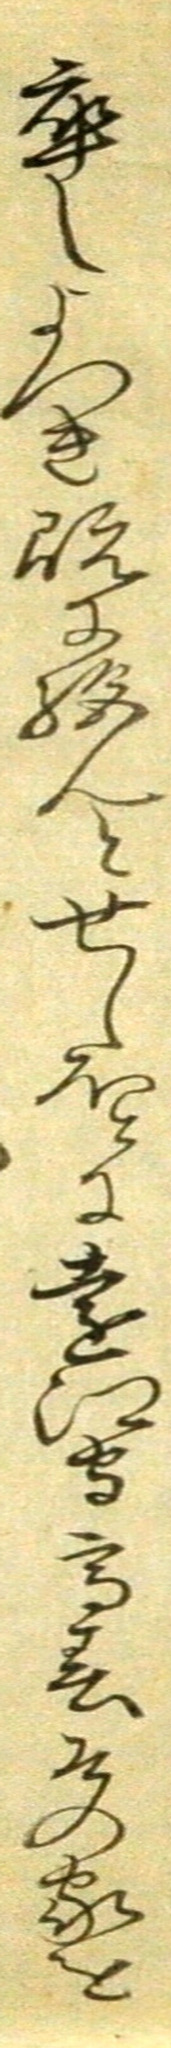卒しよつき既に絶んとせしほとに遠江守高晴その家を
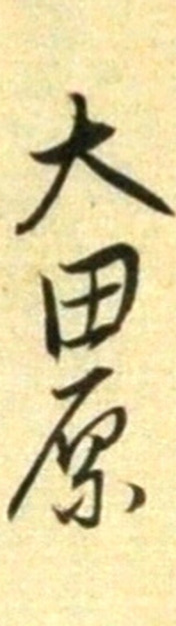大田原
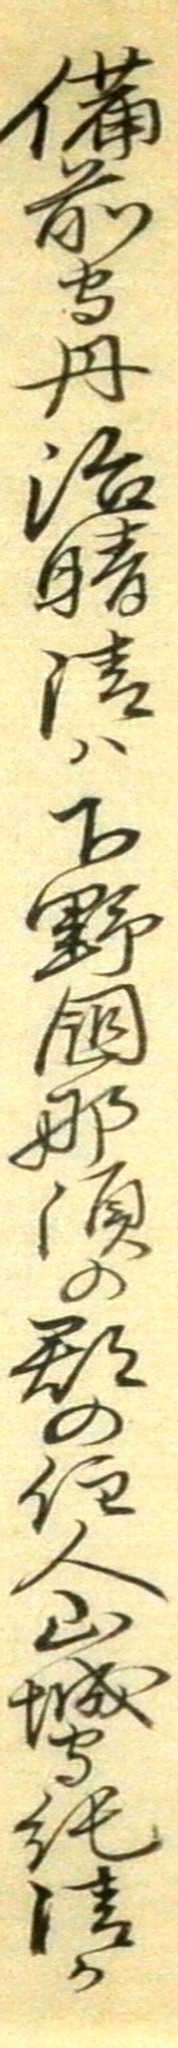備前守丹治晴清は下野国那須の郡の住人山城守純清か
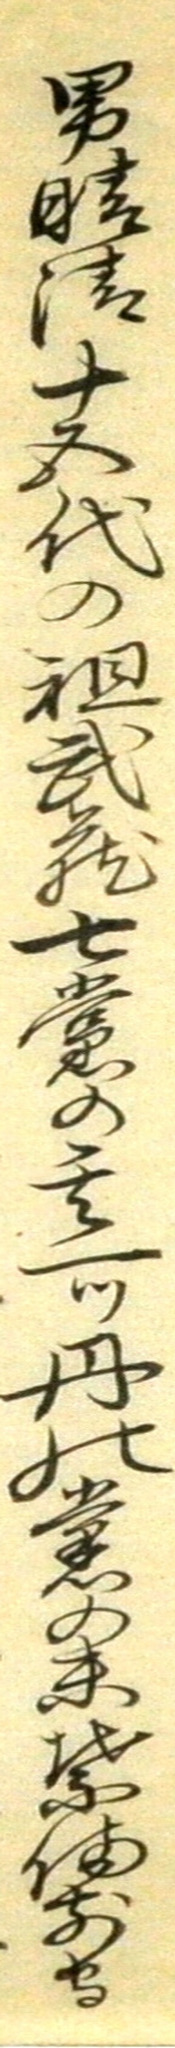男晴信十五代の祖武蔵七党の其一ッ丹の党の末葉備前守

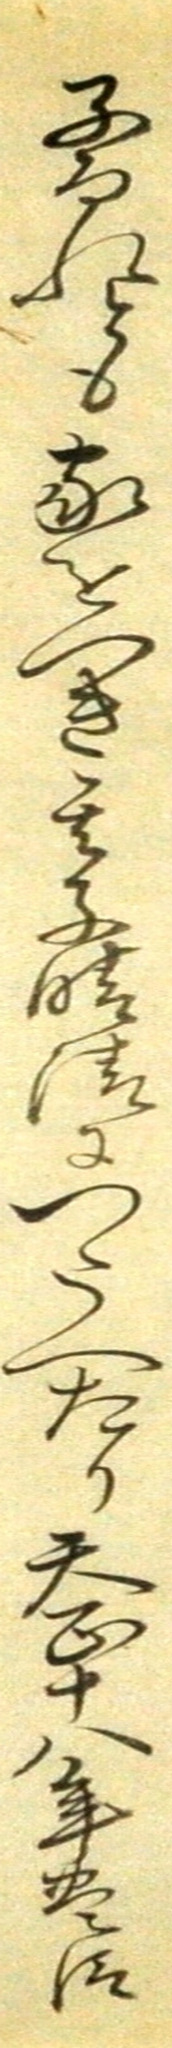子なれとも家をつき其子晴清につたへたり天正十八年豊臣
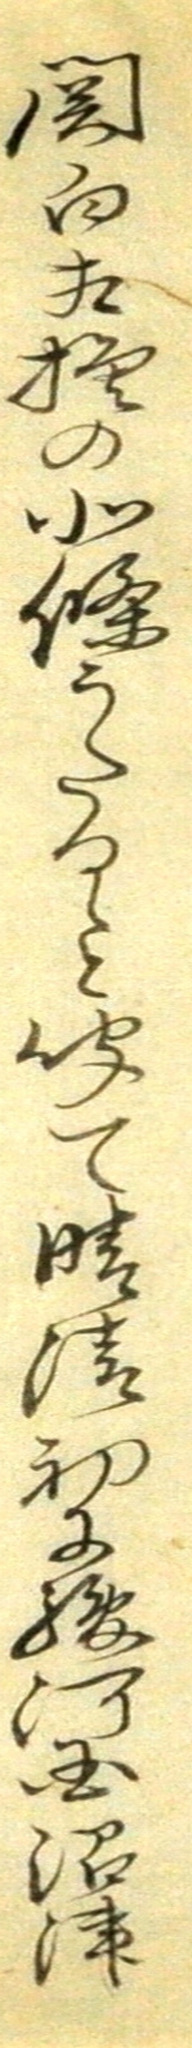関白相模の北条うたるゝと聞て晴清初に駿河国沼津
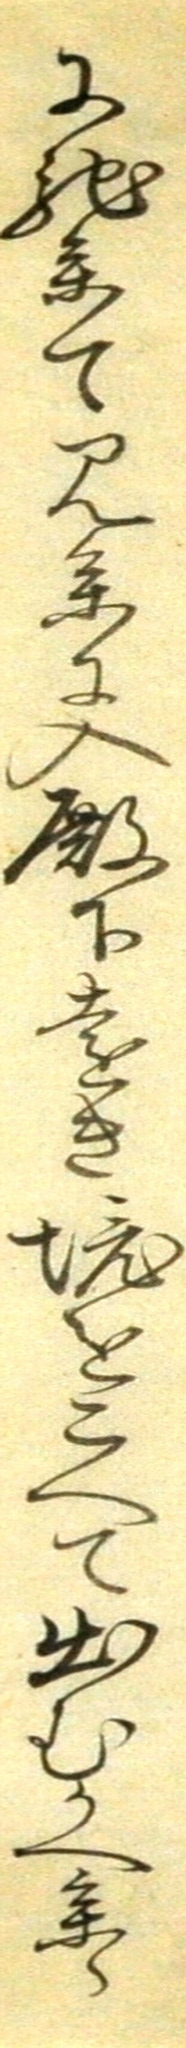に馳参て見参に入殿下遠き境をこへて出むかへ参ら
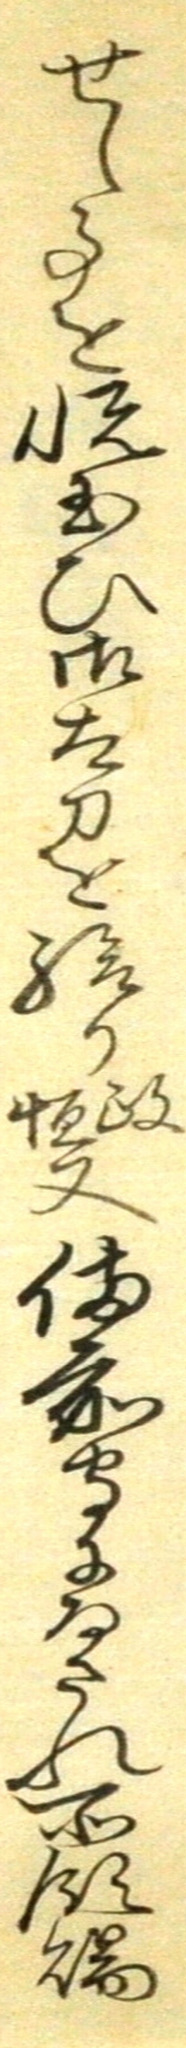せし事を悦玉ひ御太刀を給り政恒又備前守になされ所領賜
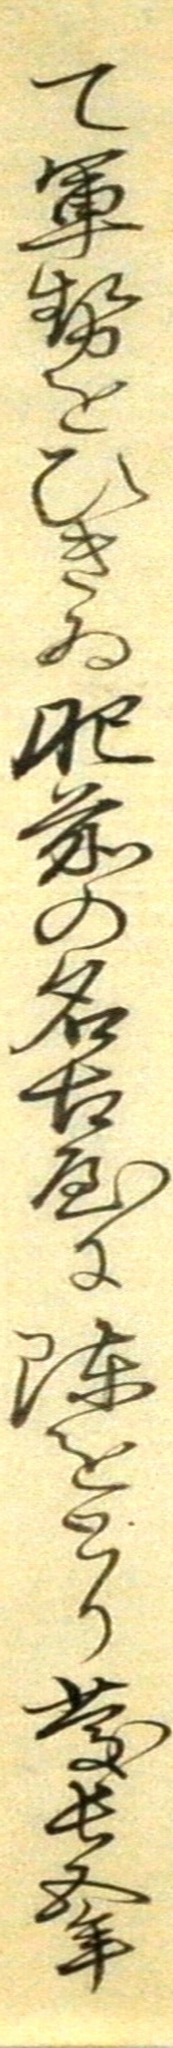て軍勢をひきゐ肥前の名古屋に陣をとり慶長五年
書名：藩翰譜（九・下）
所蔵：伊那市立高遠町図書館・合同会社AMANE
